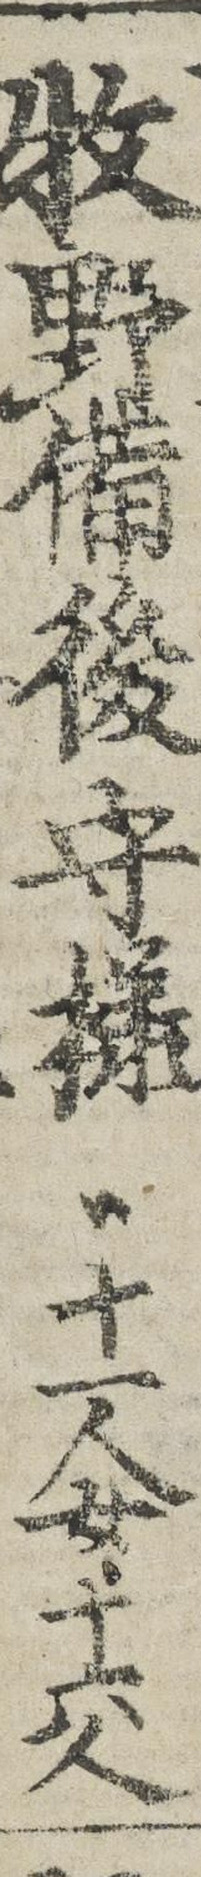牧野備後守様〻十一人女十六人
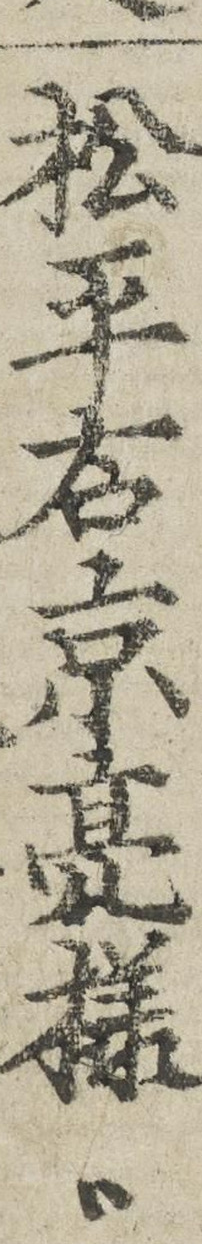松平右京亮様〻
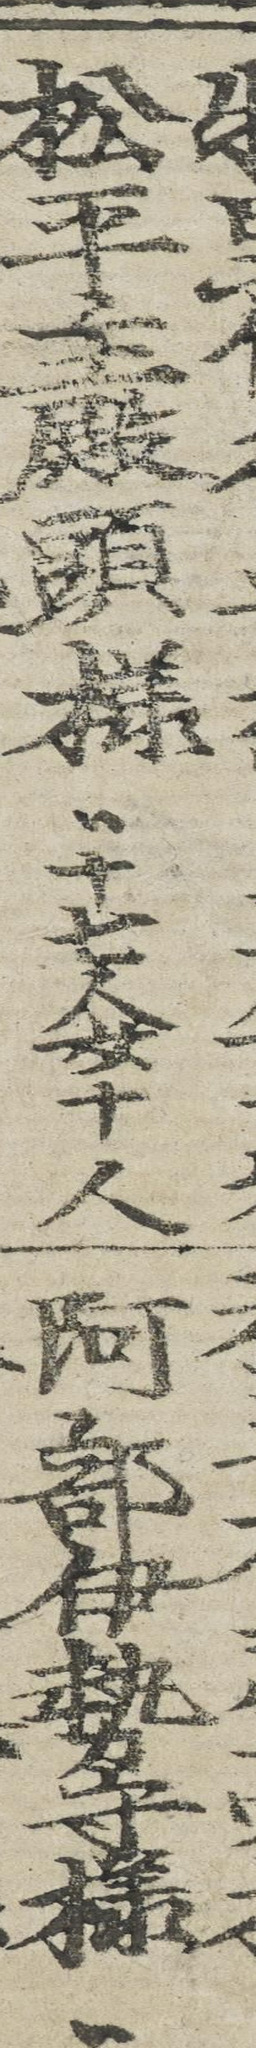松平主殿頭様〻十七人女十人
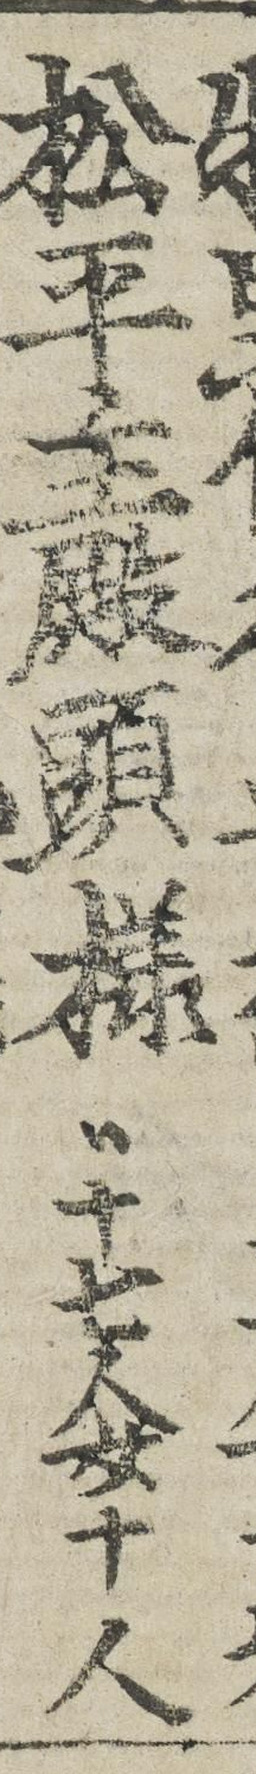松平主殿頭様〻十七人女十人
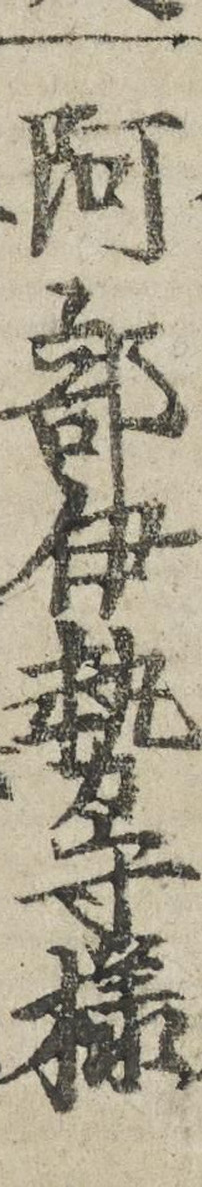阿部伊勢守様〻
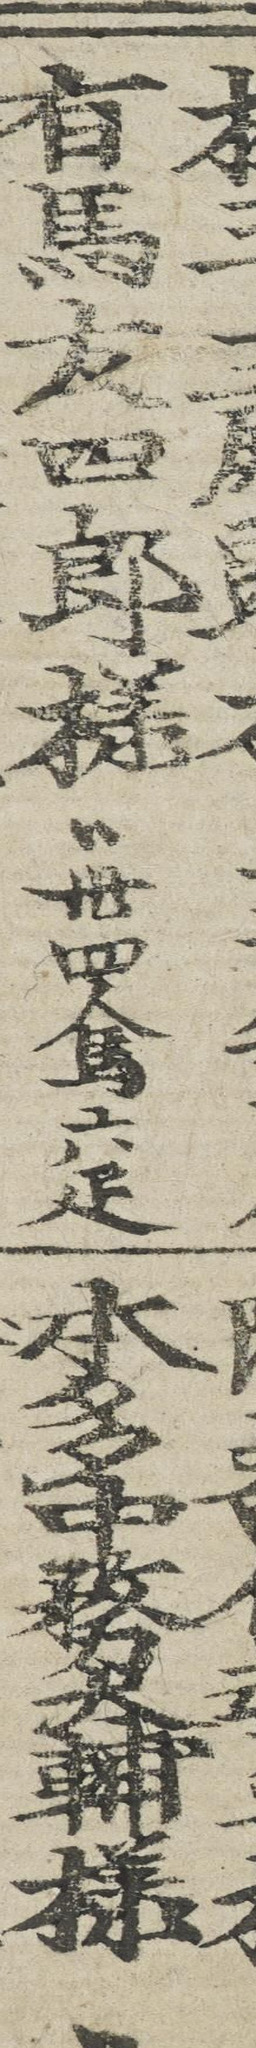有馬友四郎様〻丗四人馬六疋
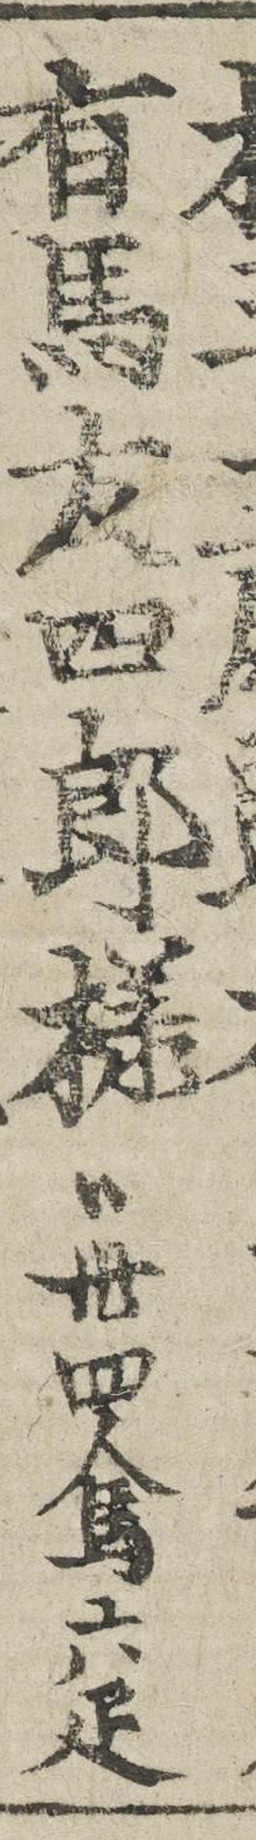有馬友四郎様〻丗四人馬六疋
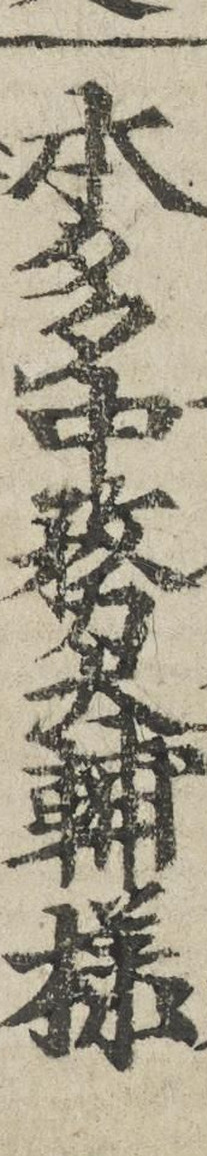本多中務大輔様〻
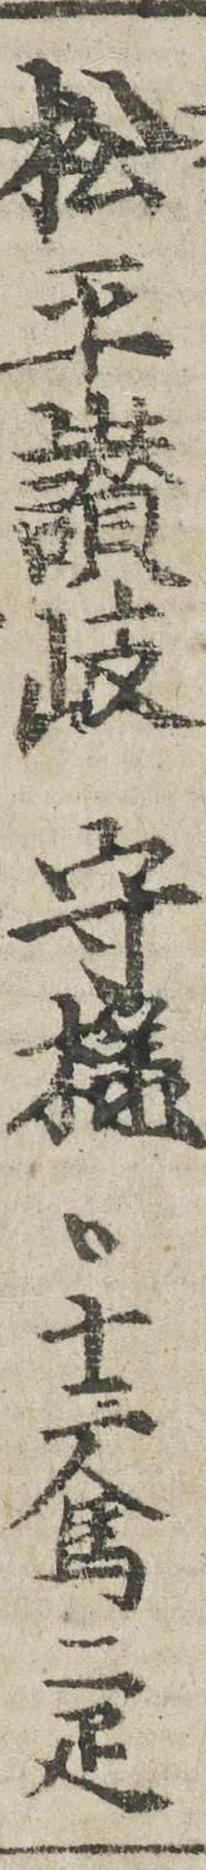松平讃岐守様〻十二人馬二疋
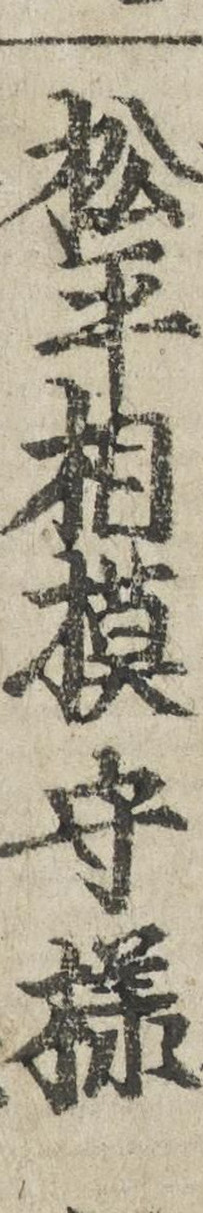松平相模守様〻
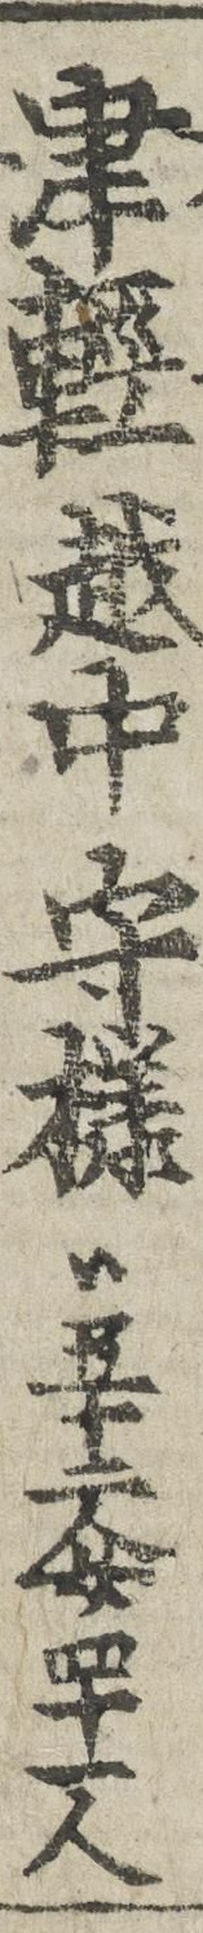津軽越中守様〻五十二人女四十一人
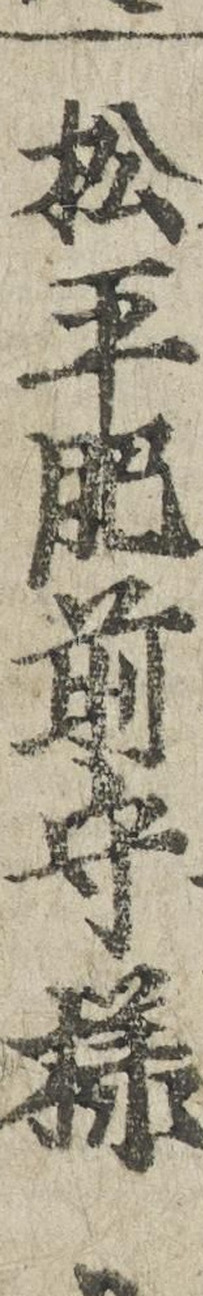松平肥前守様〻

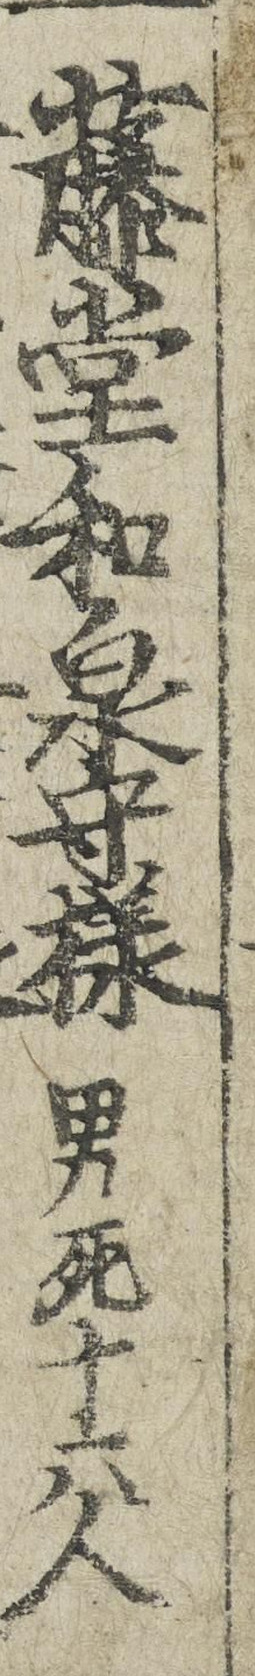藤堂和泉守様男死十六人
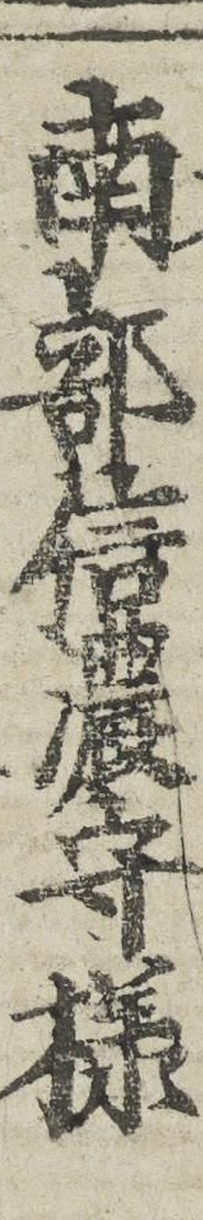南部信濃守様〻
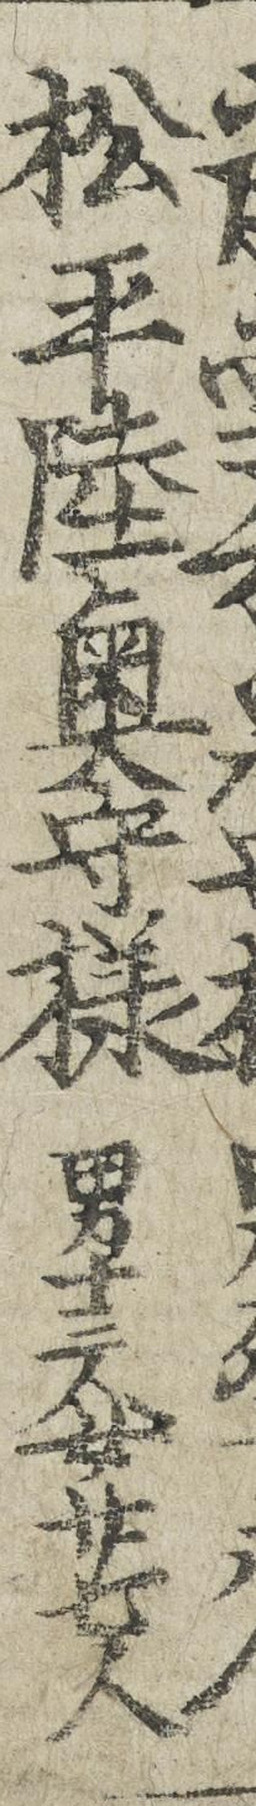松平陸奥守様男十三人女廿七人
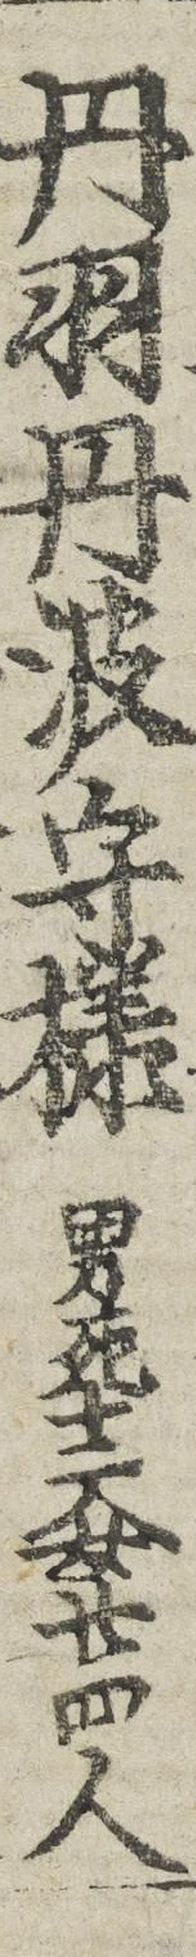丹羽丹波守様男死十二人女廿四人
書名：[明暦大火に関する冊子]
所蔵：東京大学地震研究所図書室 Earthquake Research Institute Library, The University of Tokyo, JAPAN
